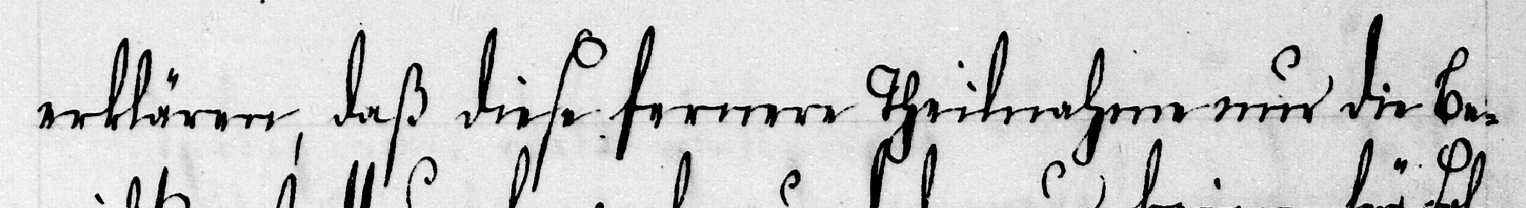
erklären, daß diese fernere Theilnahme nur die Be¬
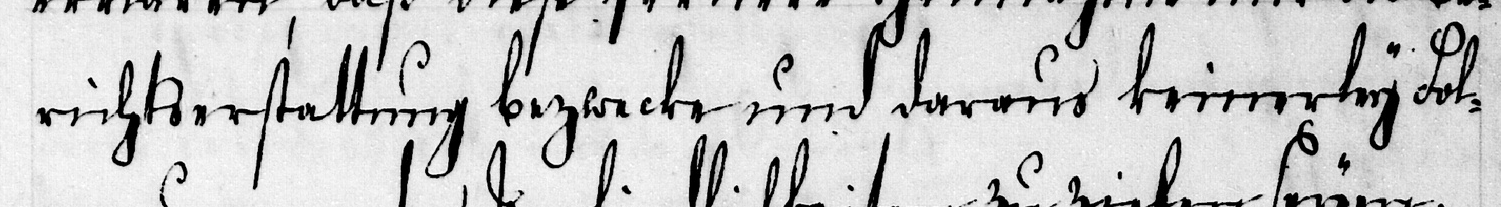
richtserstattung bezwecke und daraus keinerley Fol¬
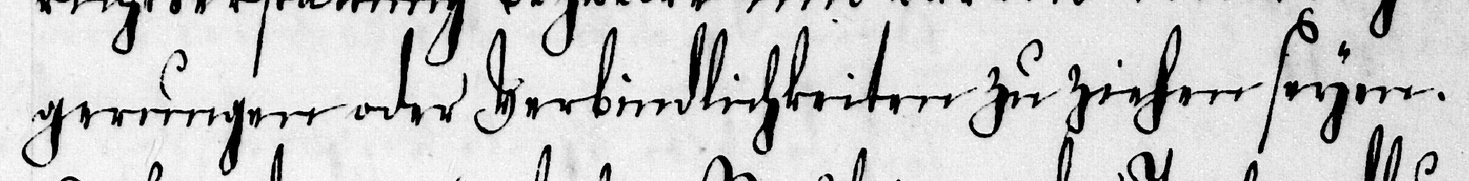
gerungen oder Verbindlichkeiten zu ziehen seyen.
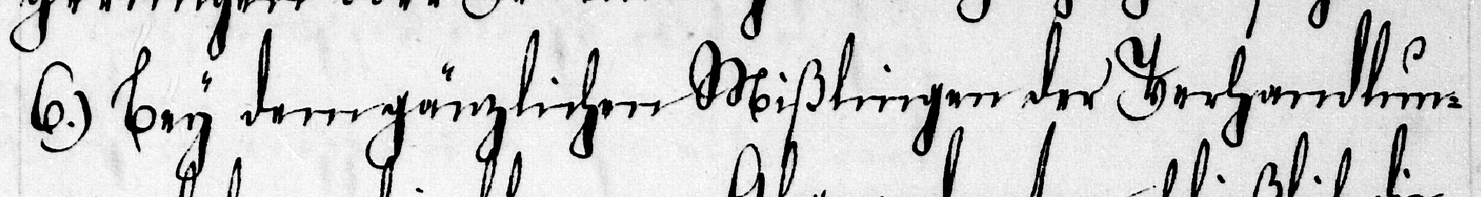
6.) Bey dem gänzlichen Mißlingen der Verhandlun¬
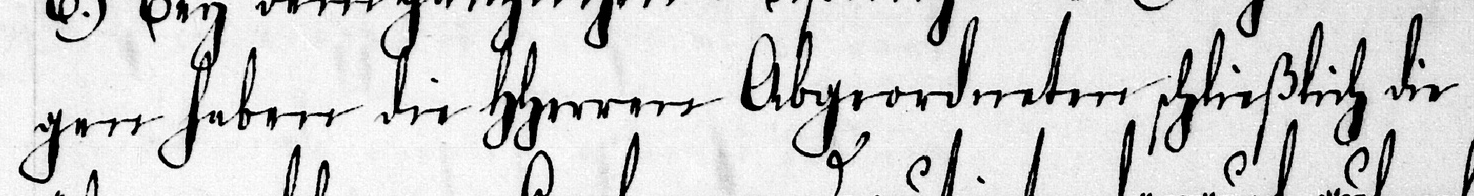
gen haben die HHerren Abgeordneten schließlich die
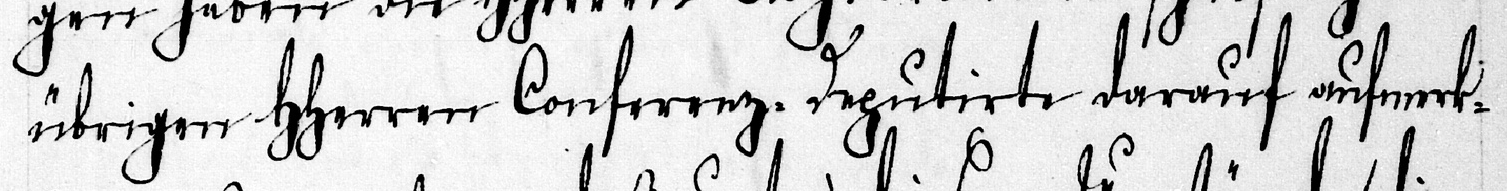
übrigen HHerren Conferenz-Deputirte darauf aufmerk¬
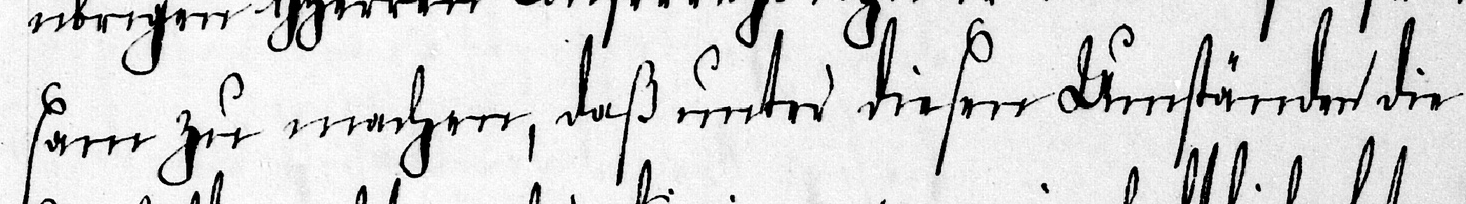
sam zu machen, daß unter diesen Umständen die
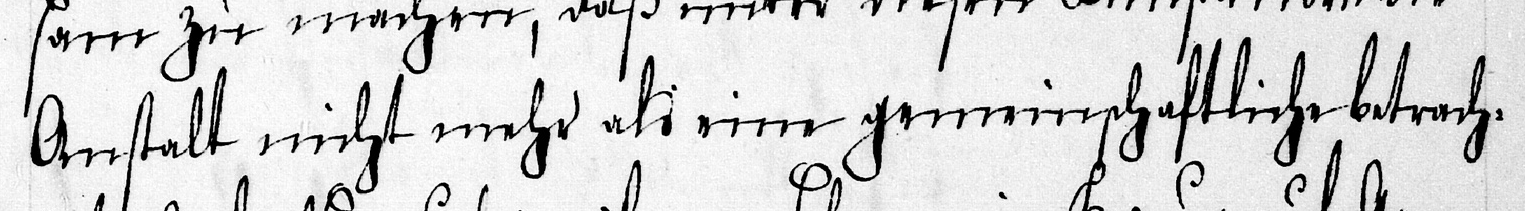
Anstalt nicht mehr als eine gemeinschaftliche betrach¬
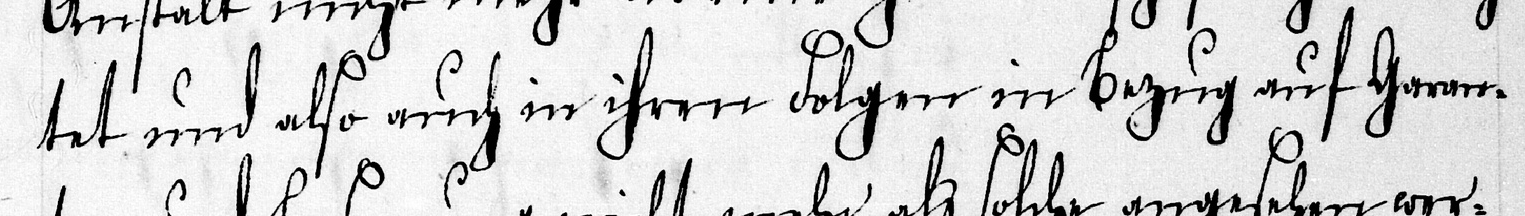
tet und also auch in ihren Folgen in Bezug auf Garan¬
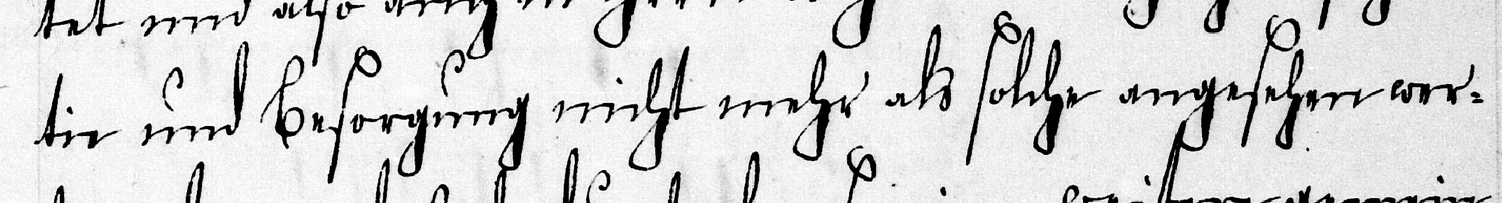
tie und Besorgung nicht mehr als solche angesehen wer¬
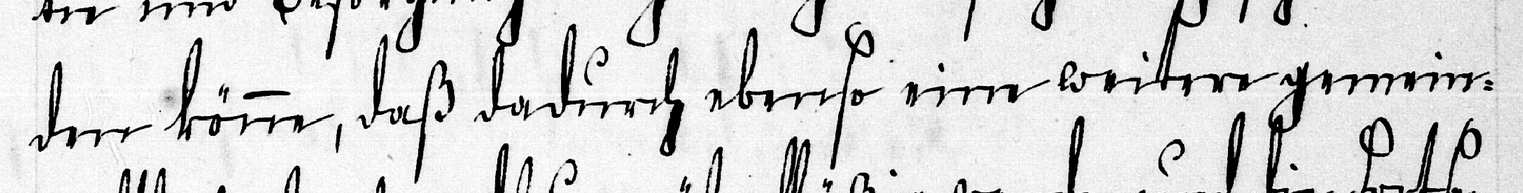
den könne, daß dadurch ebenso eine weitere gemeins¬
